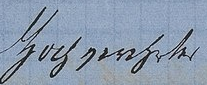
Hochverehrter
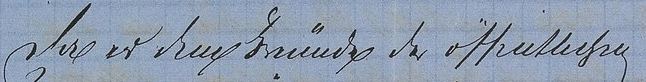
Da es durch Gründe der öffentlichen
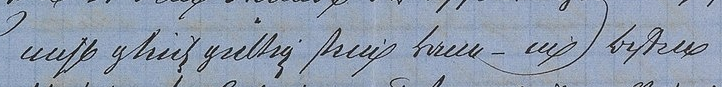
nicht gleichgültig sein kann – in weßen
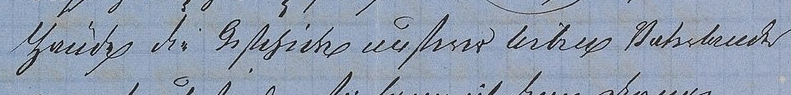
Hände die Geschicke unserer lieben Vaterlandes
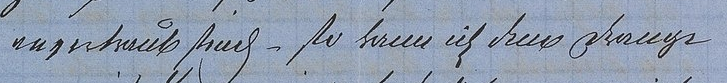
anvertraut sind – so kann ich dem Drange
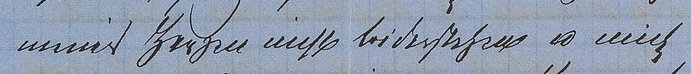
meines Herzens nicht widerstehen & mich
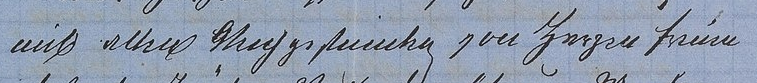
mit allen Gleichgesinnten von Herzen freuen
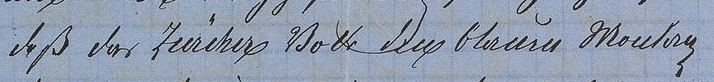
daß das Zürcher Volk den blauen Montag
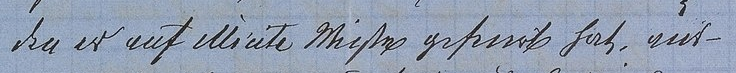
den es auf illicite Weise gefeiert hat, aus-
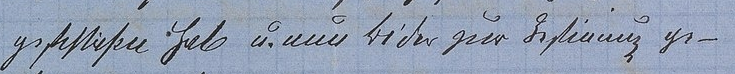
geschloßen hat u. nun wider zur Besinnung ge-
